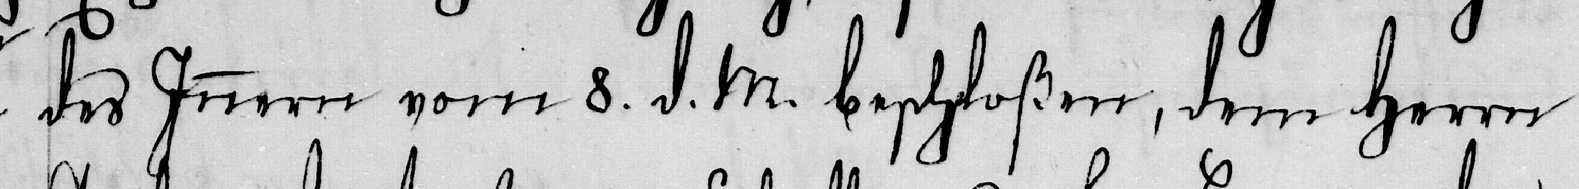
des Innern vom 8. v. M. beschloßen, dem Herrn
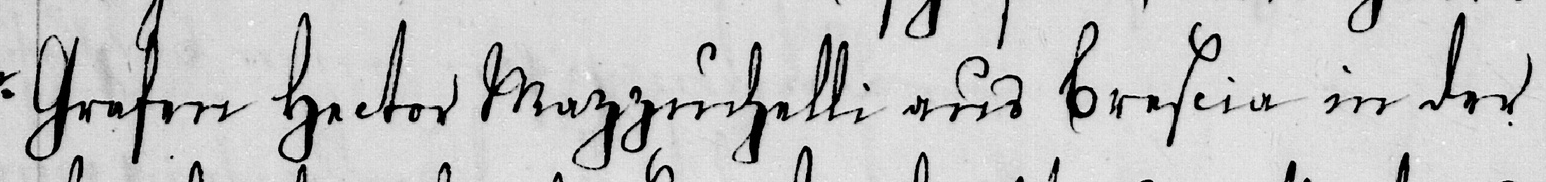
Grafen Hector Mazzuchelli aus Brescia in der
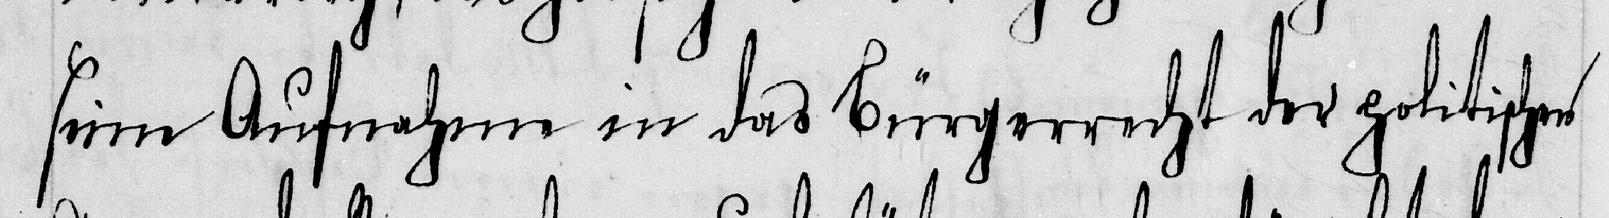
seine Aufnahme in das Bürgerrecht der politischen
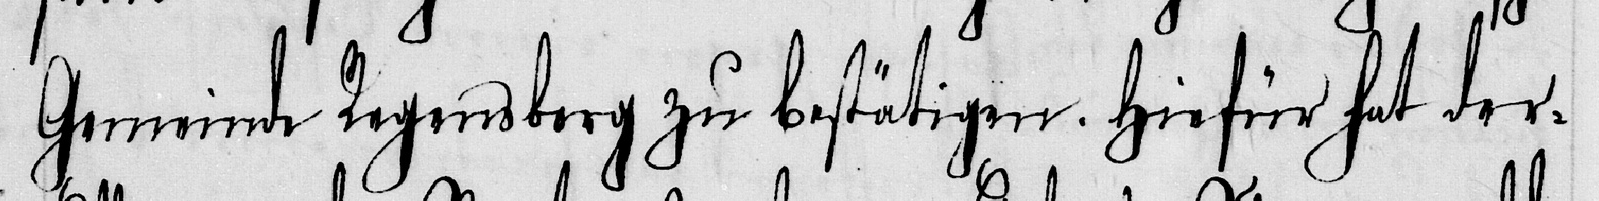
Gemeinde Regensberg zu bestätigen. Hiefür hat der¬
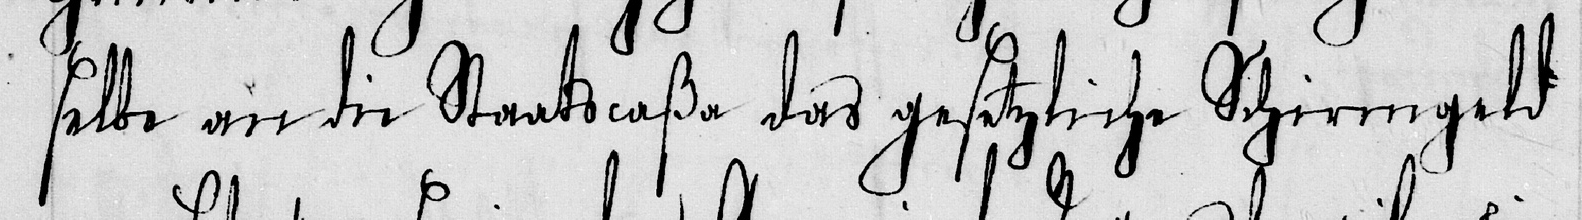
selbe an die Staatscaßa das gesetzliche Schirmgeld
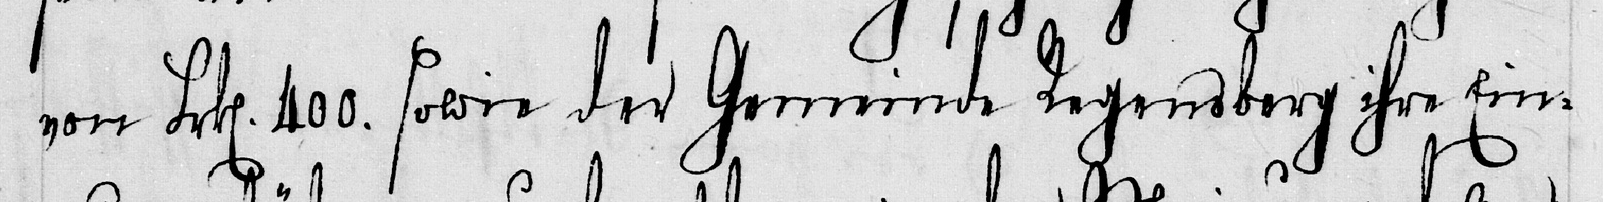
von Frk[en] 400. sowie der Gemeinde Regensberg ihre Ein¬
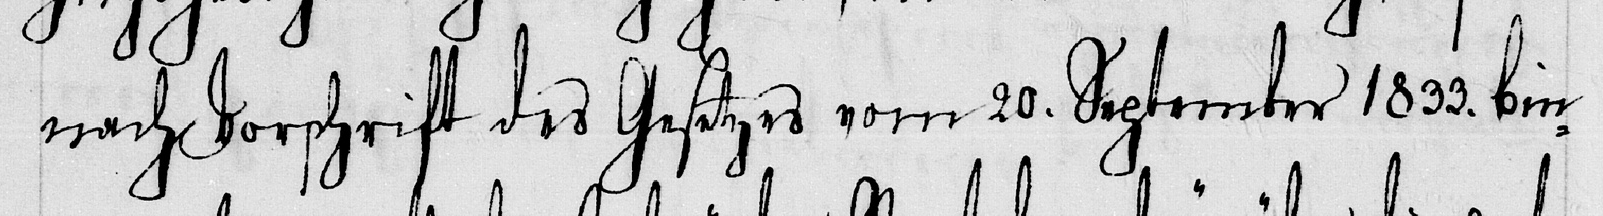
nach Vorschrift des Gesetzes vom 20. September 1833. bin¬
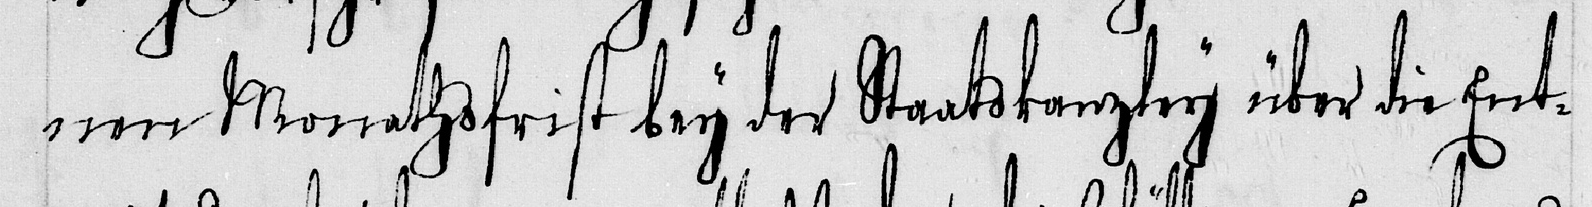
nen Monatsfrist bey der Staatskanzley über die Ent¬
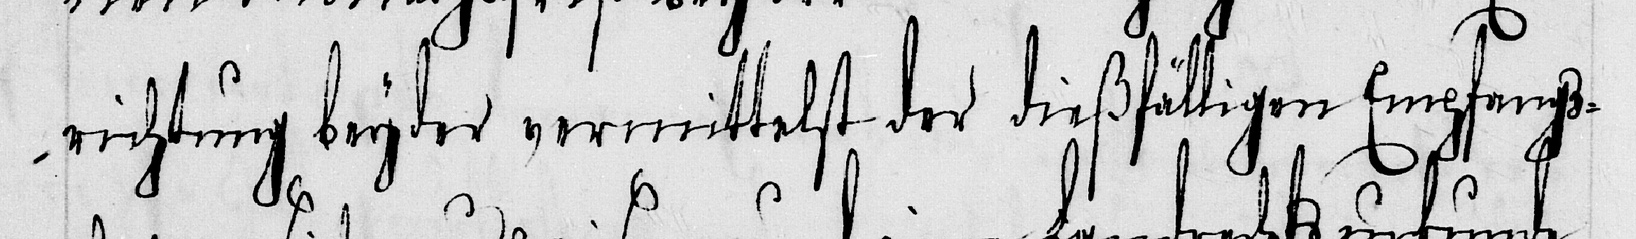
richtung beyder vermittelst der dießfälligen Empfangs¬
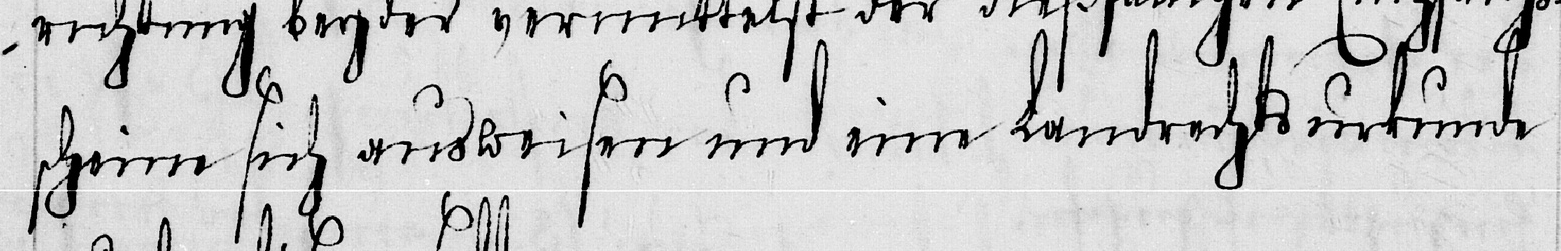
scheine sich ausweisen und eine Landrechtsurkunde
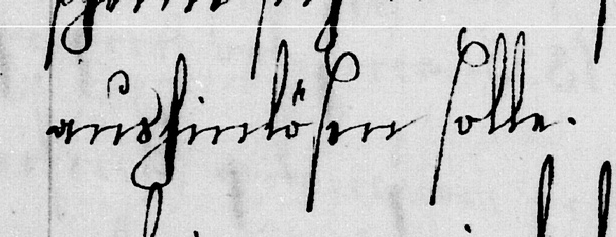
aushinlösen solle.
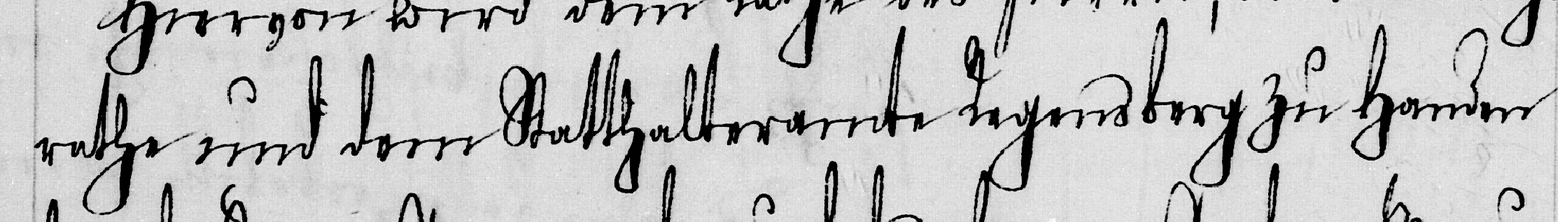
rathe und dem Statthalteramt Regensberg zu Handen
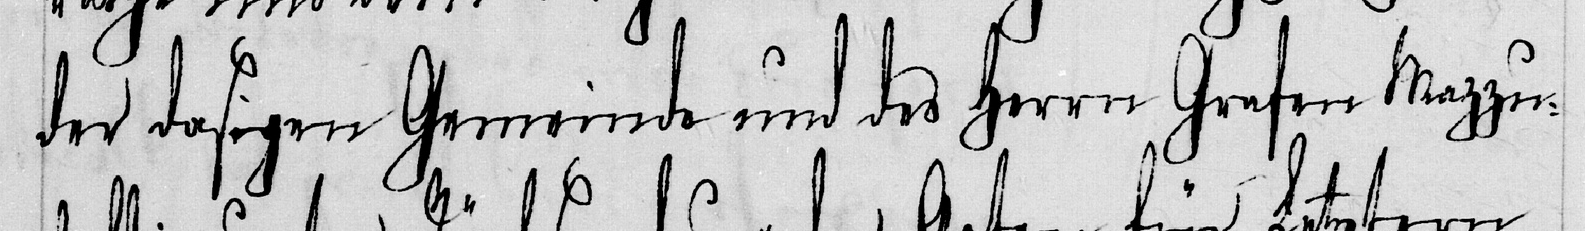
der dasigen Gemeinde und des Herrn Grafen Mazzu¬
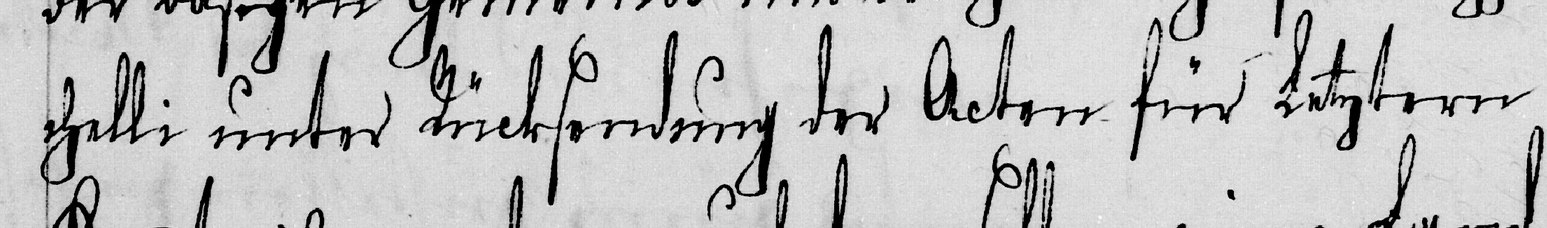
chelli unter Rücksendung der Acten für Letztern
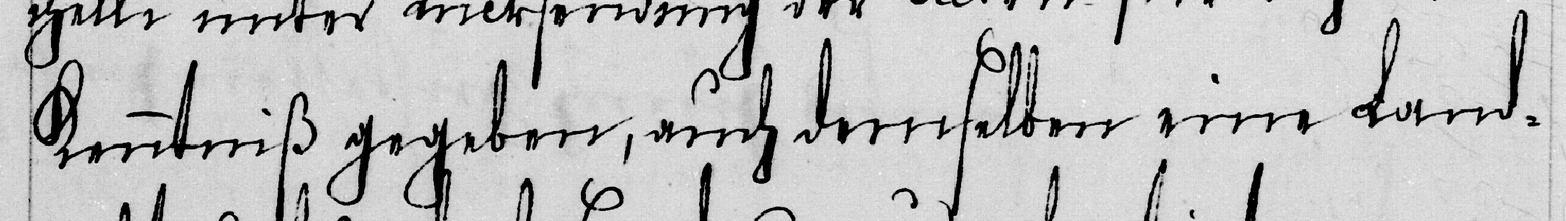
Kenntniß gegeben, auch demselben eine Land¬
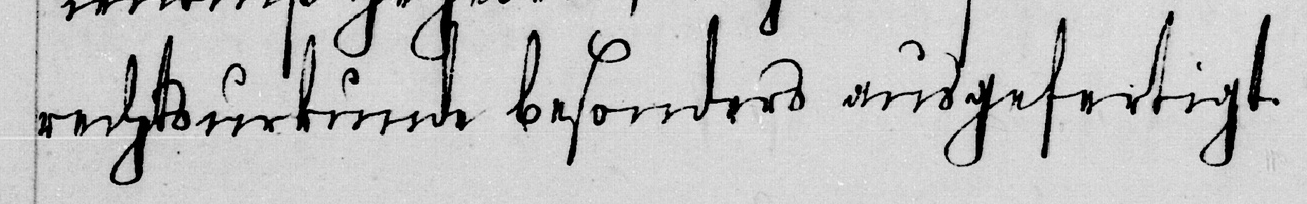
rechtsurkunde besonders ausgefertigt.
